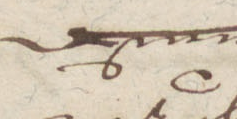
Dieser
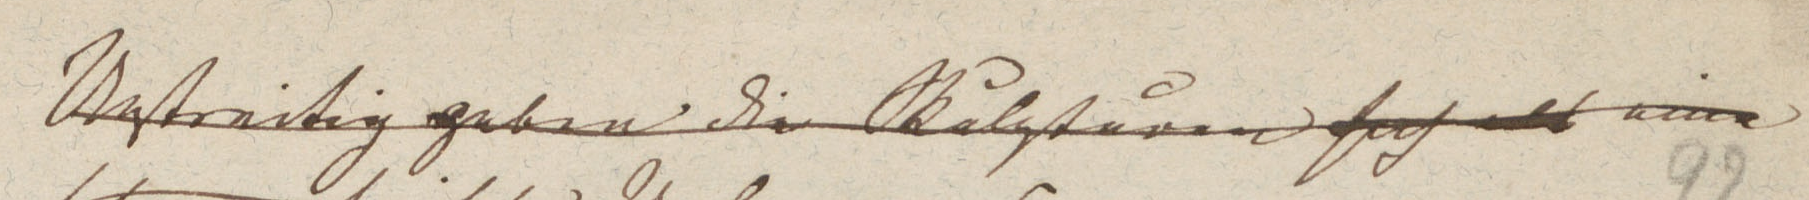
Unstreitig geben die Skulpturen sich als eine
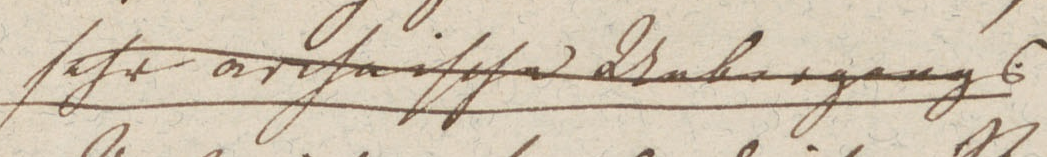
sehr archaische Uebergangs
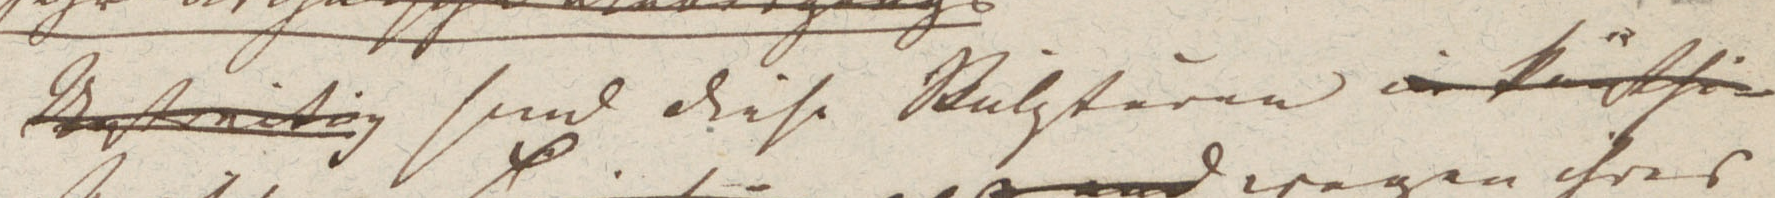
Unstreitig sind diese Skulpturen in kunsthi-
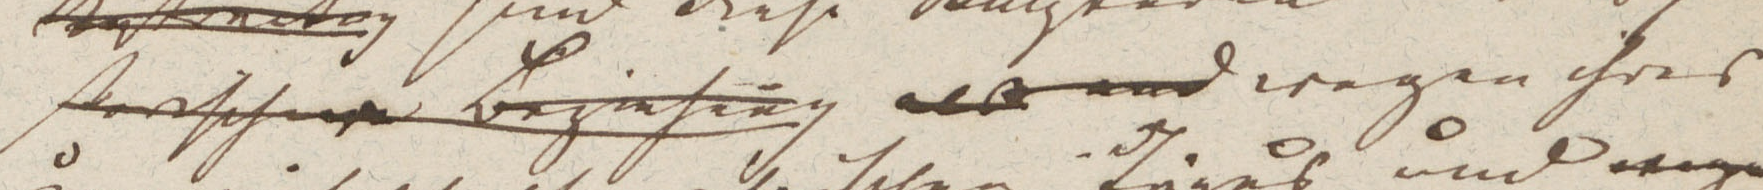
storischer Beziehung als und wegen ihres
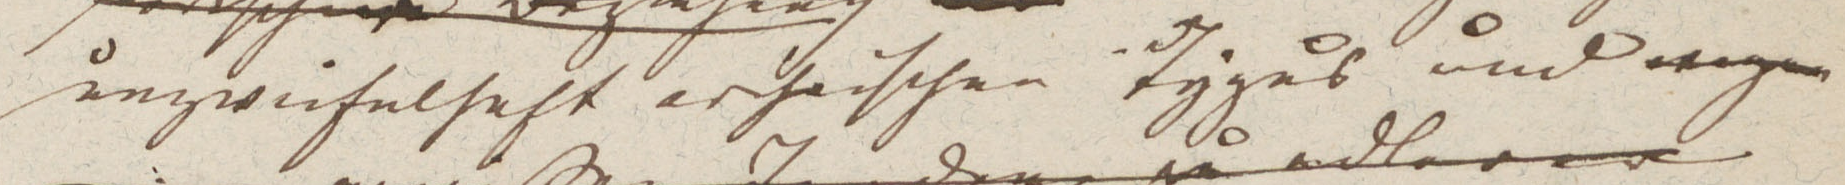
unzweifelhaft archaischen Typus und wegen
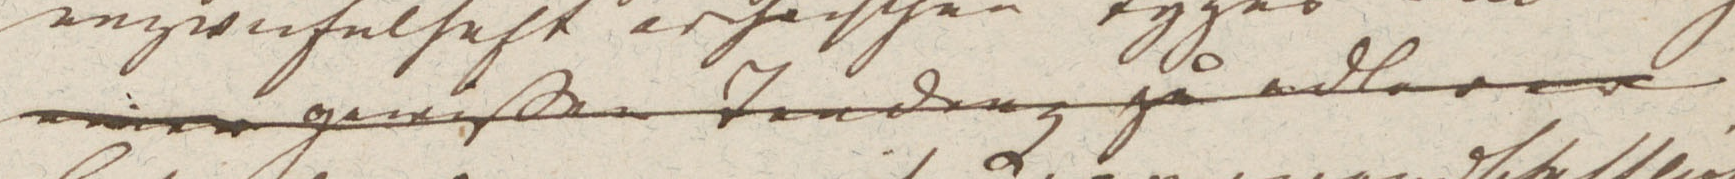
einer gewissen Tendenz zu edlerer
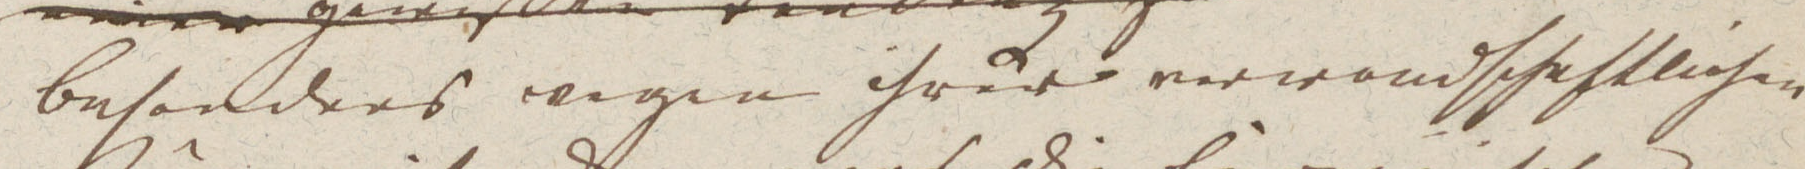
besonders wegen ihrer verwandschaftlichen
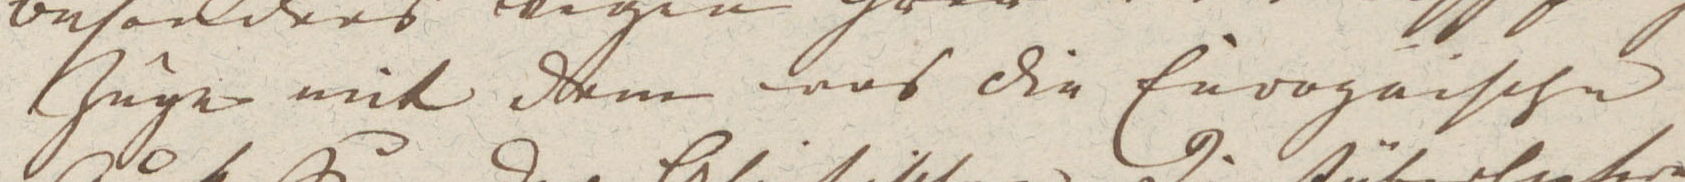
Züge mit dem was die Europäische
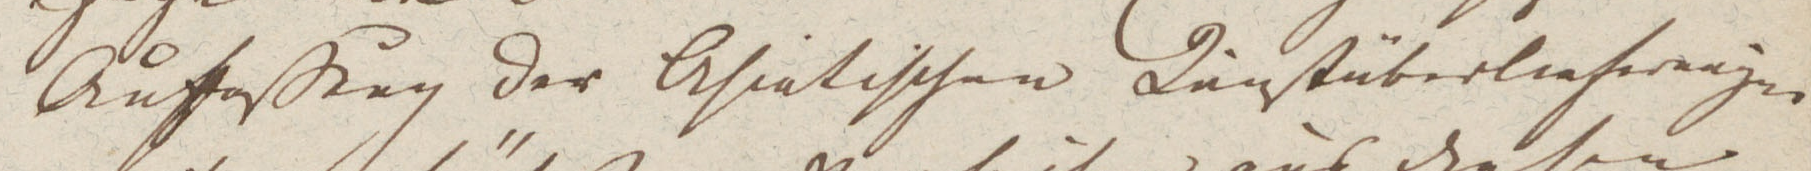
Auffassung der Asiatischen Kunstüberlieferungen
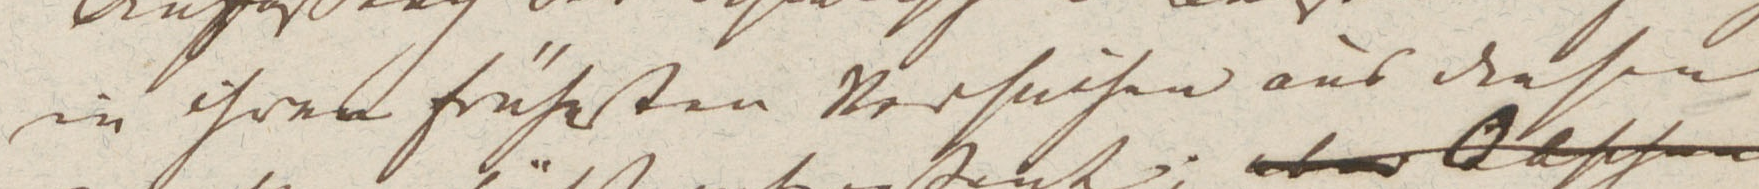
in ihren frühesten Versuchen aus diesen
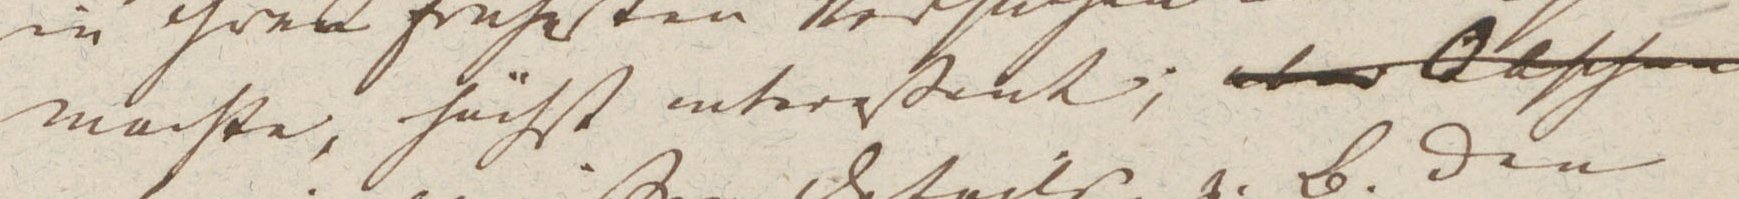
machte, höchst interessant; aber bschon
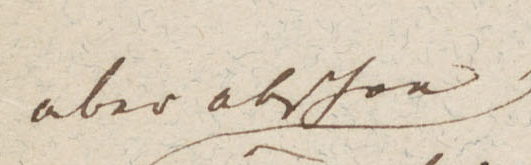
aber obschon
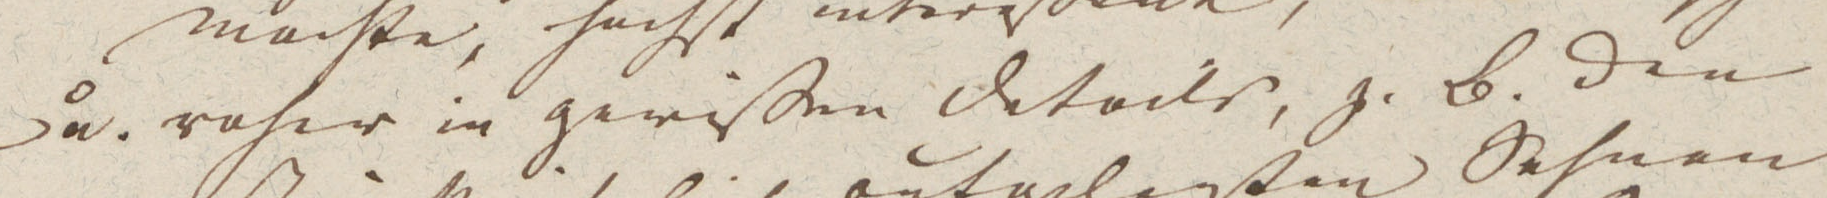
u. roher in gewissen Details, z. B. den
